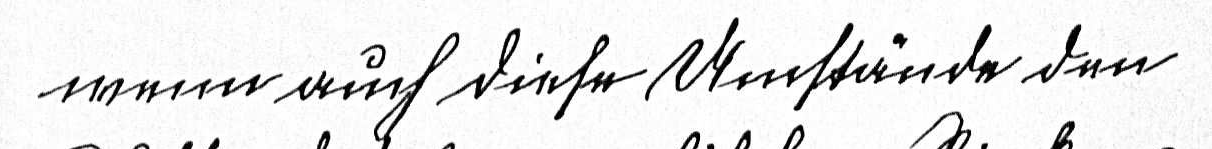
wenn auch diese Umstände den
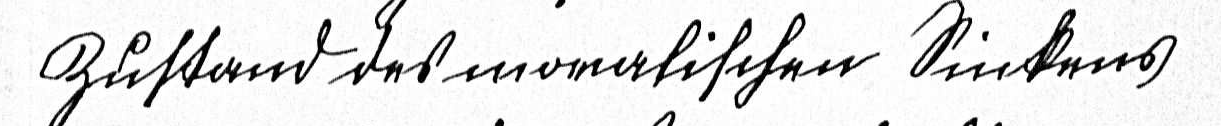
Zustand des moralischen Sinkens
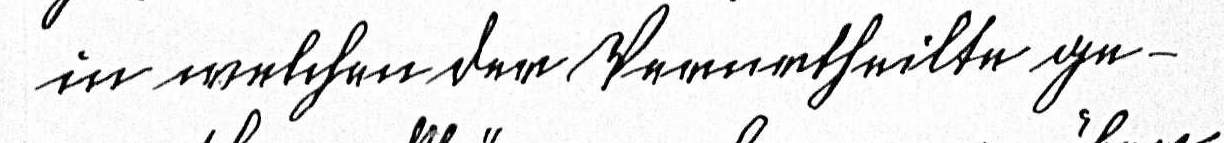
in ewlchen der Verurtheilte ge¬
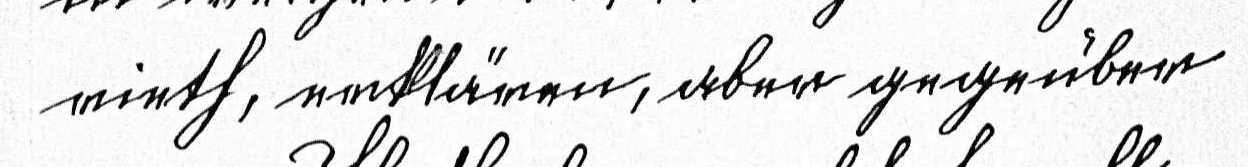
rieth, erklären, aber gegenüber
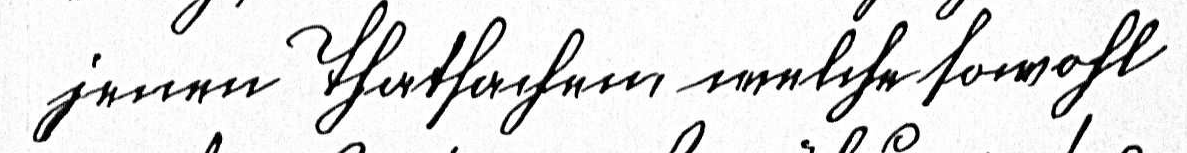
jenen Thatsachen welche sowohl
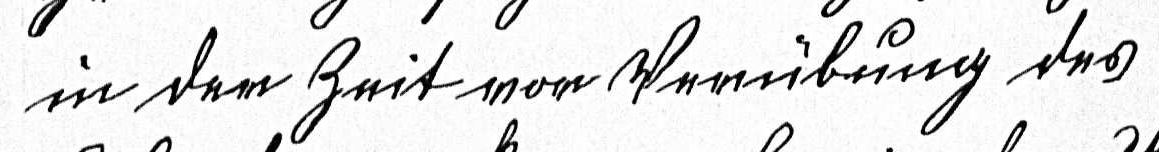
in der Zeit vor Verübung des
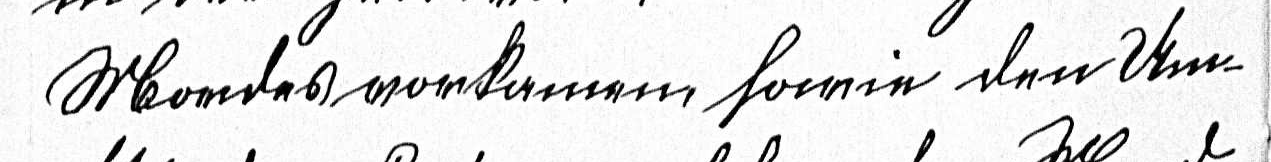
Mordes vorkamen sowie den Um¬
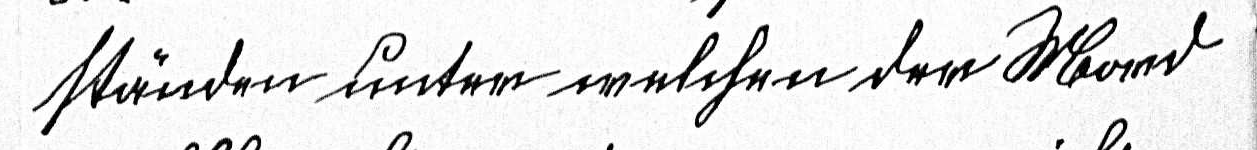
ständen unter welchen der Mord
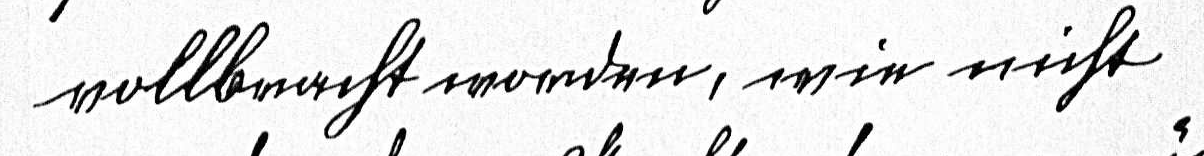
vollbracht worden, wie nicht
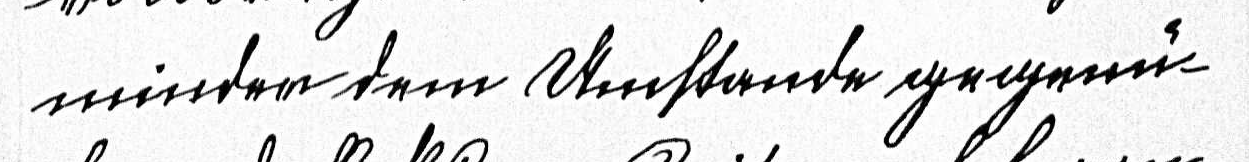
minder dem Umstande gegenü¬
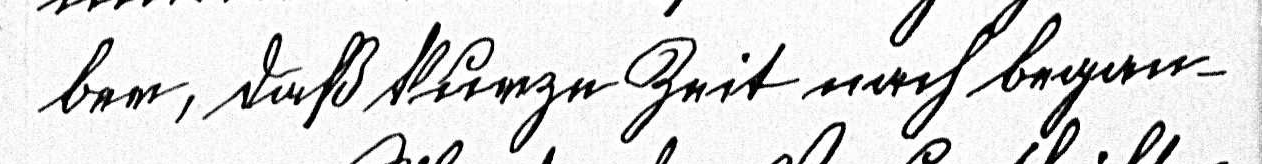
ber, daß kurze Zeit nach began¬
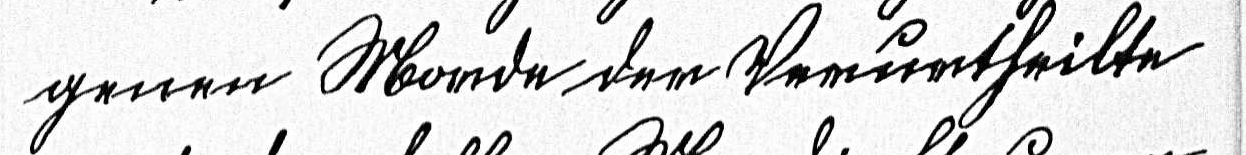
genen Morde der Verurtheilte
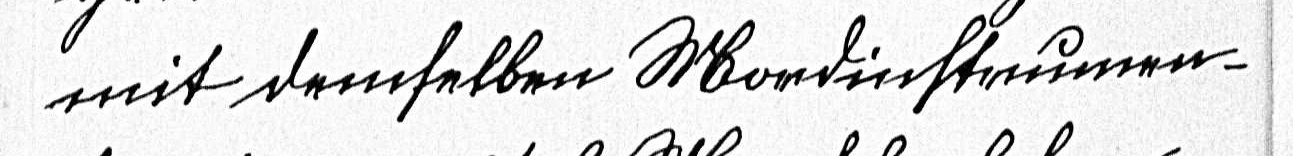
mit demselben Mordinstrumen¬
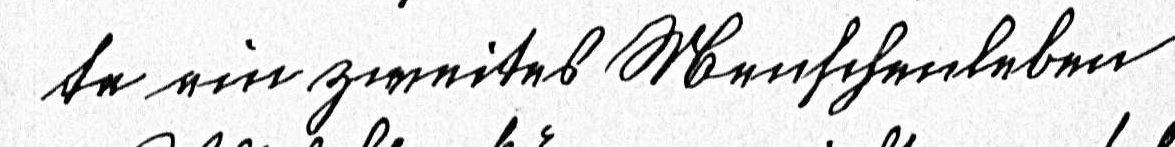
te ein zweites Menschenleben
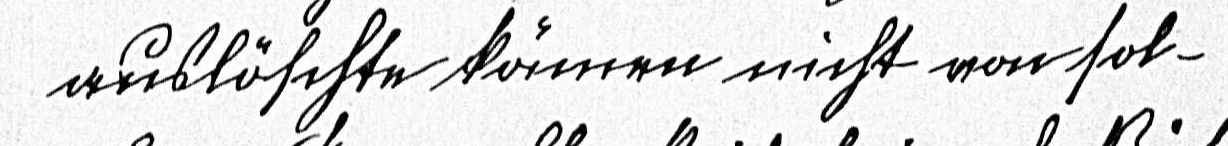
auslöschte können nicht von sol¬
